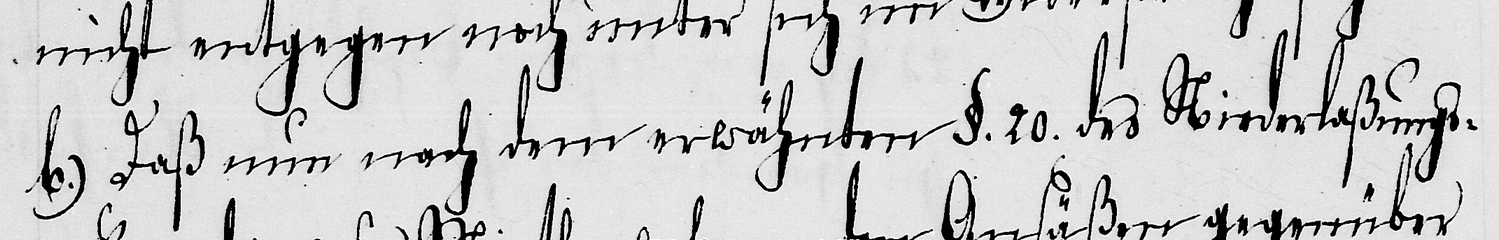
b.) Daß nun nach dem erwähnten §. 20. des Niederlaßungs¬
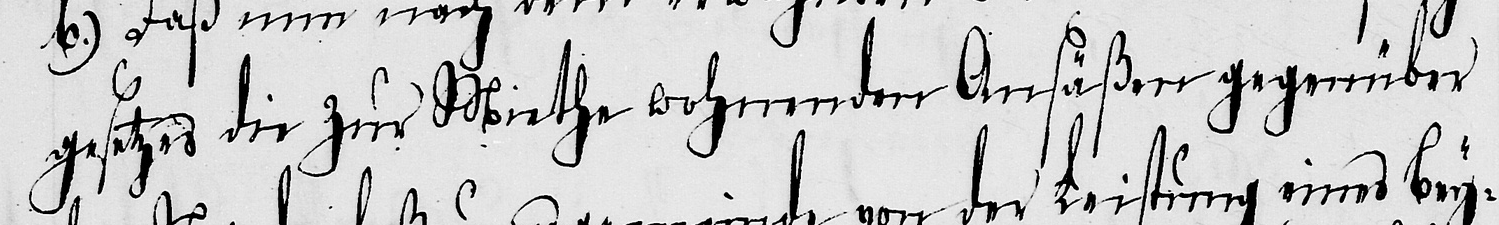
gesetzes die zur Miethe wohnenden Ansäßen gegenüber
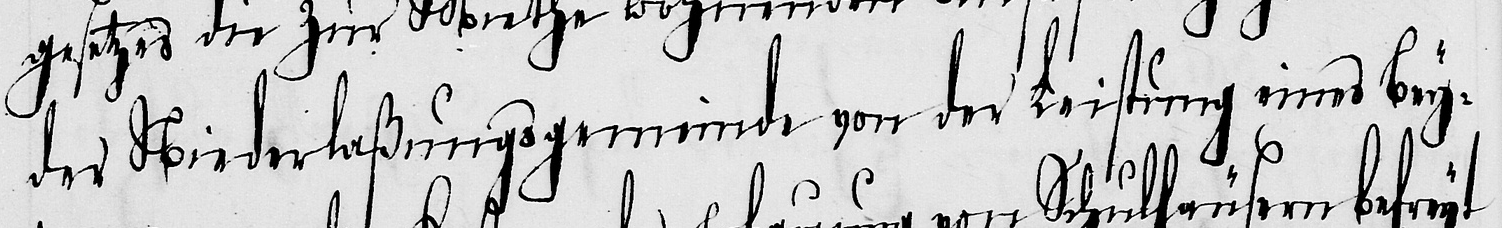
der Niederlaßungsgemeinde von der Leistung eines Bey¬
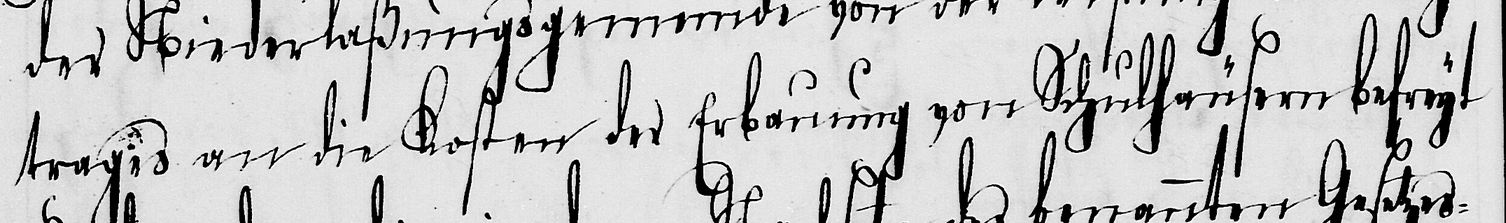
trages an die Kosten der Erbauung von Schulhäusern befreyt
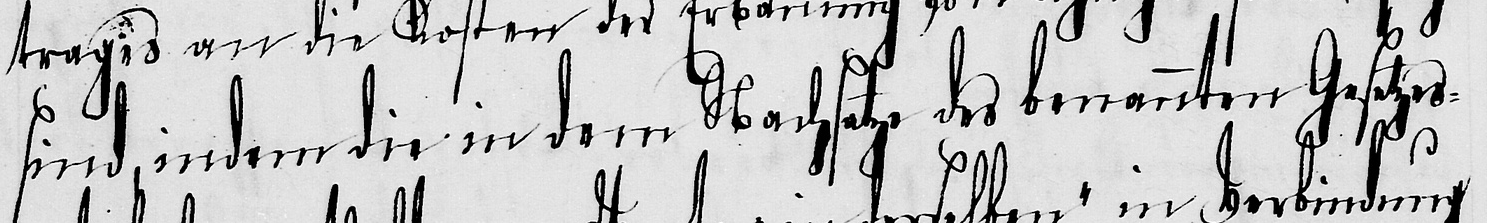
sind, indem die in dem Nachsatze des benannten Ges¬
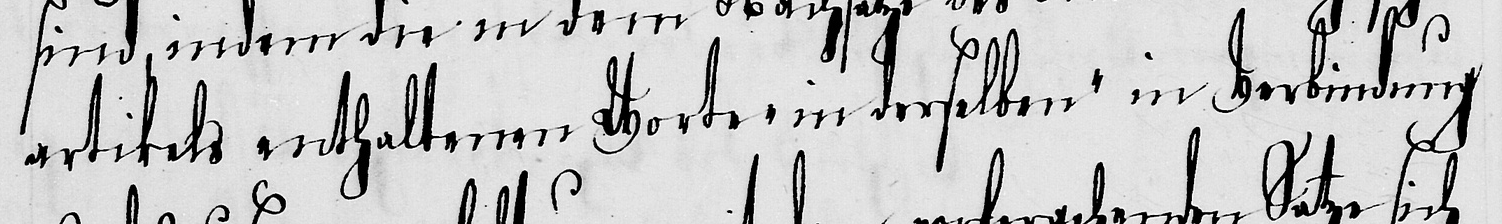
artikels enthaltenen Worte „in derselben“ in Verbindung
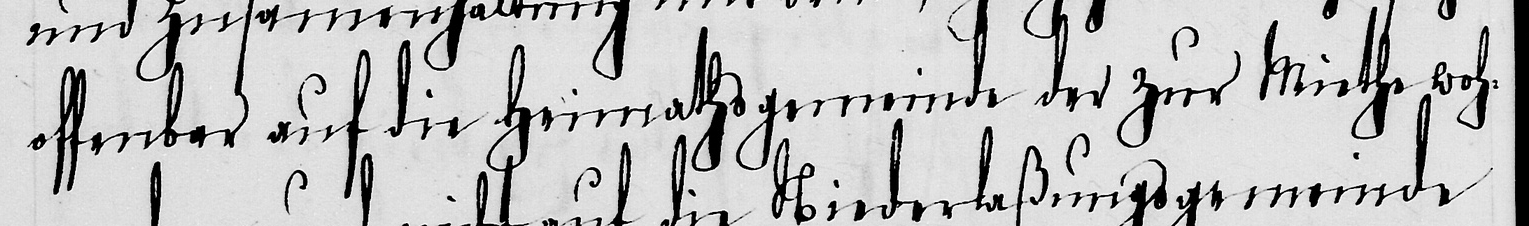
offenbar auf die Heimathsgemeinde der zur Miethe woh¬
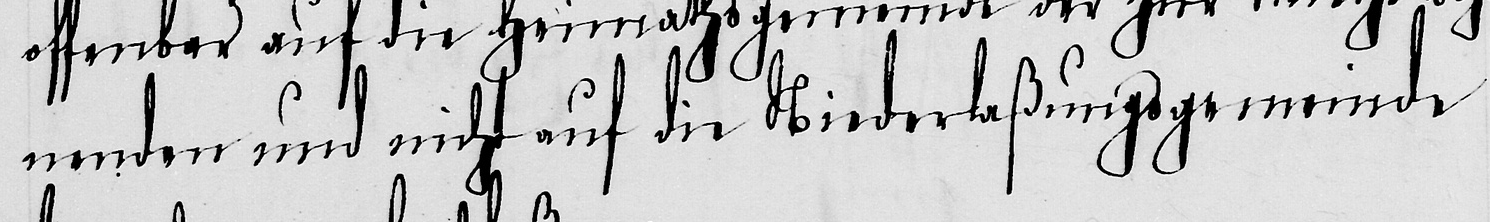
nenden und nicht auf die Niederlaßungsgemeinde
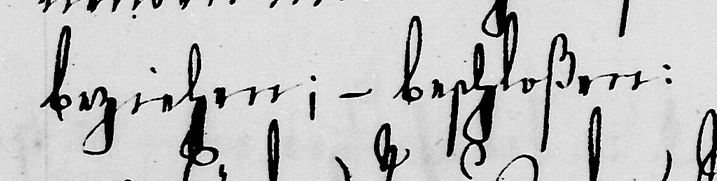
beziehen, – beschloßen:
